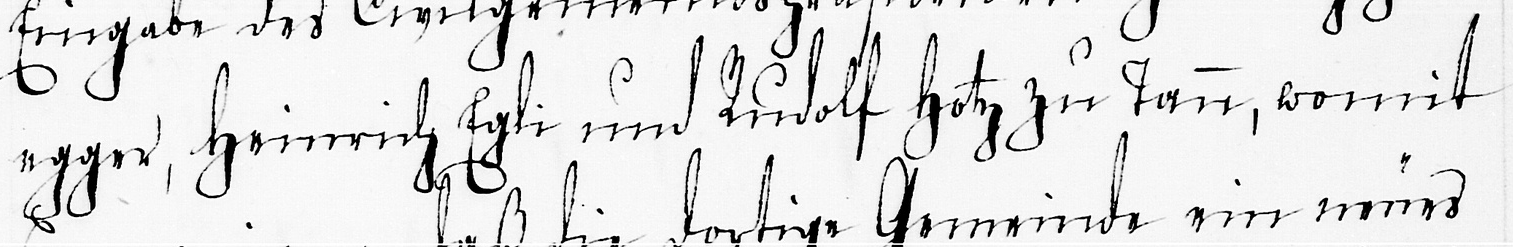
egger, Heinrich Egli und Rudolf Hotz zu Tann, womit
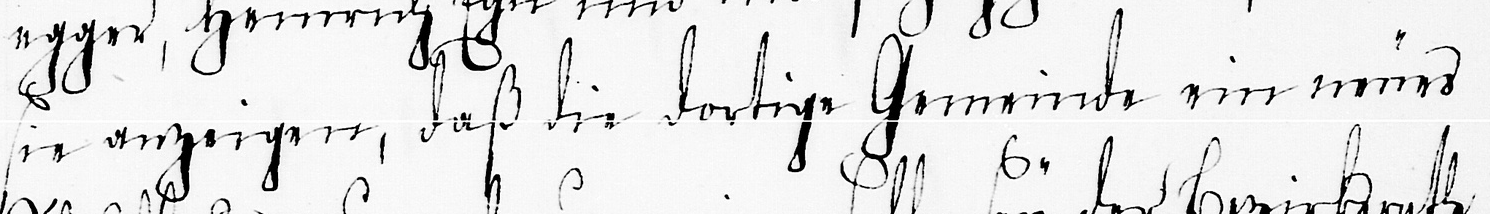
sie anzeigen, daß die dortige Gemeinde ein neues
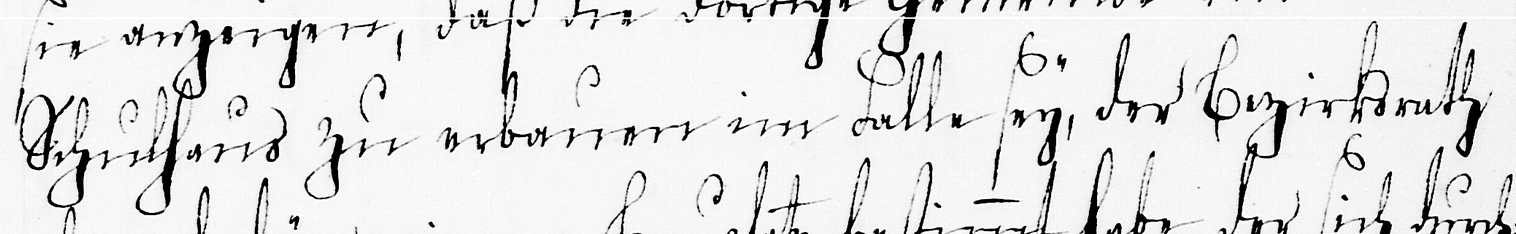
Schulhaus zu erbauen im Falle sey, der Bezirksrath
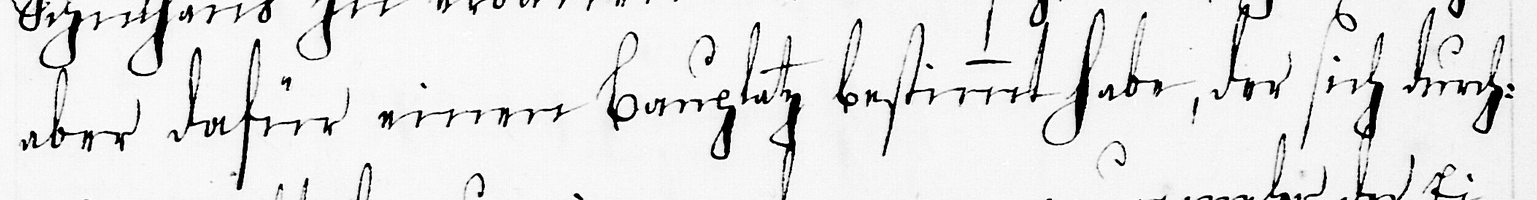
aber dafür einen Bauplatz bestimmt habe, der sich durc¬
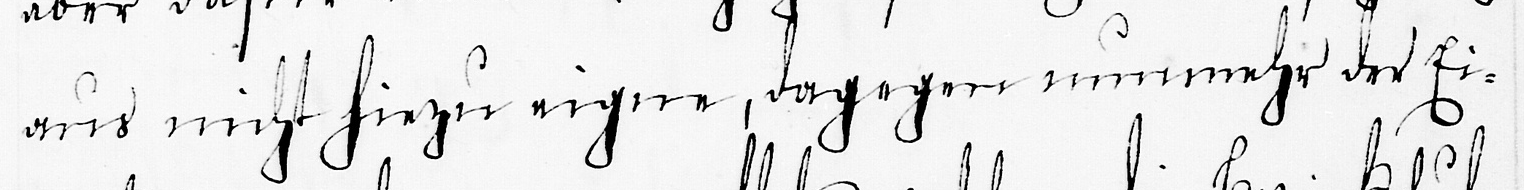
haus nicht hiezu eigne, dagegen nunmehr der Ei¬
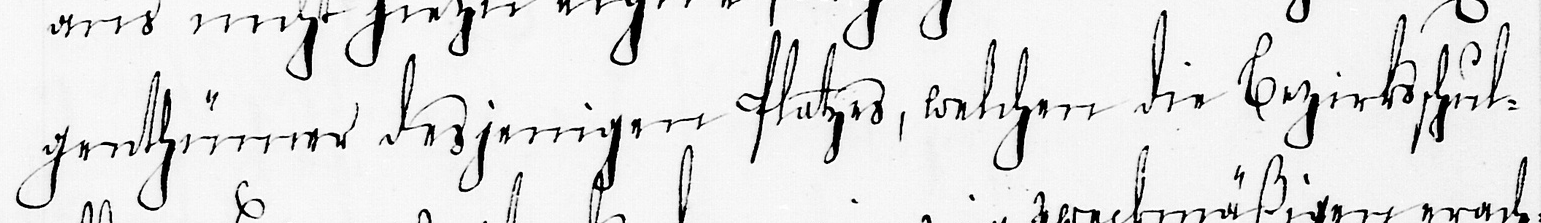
genthümer desjenigen Platzes, welchen die Bezirksschul¬
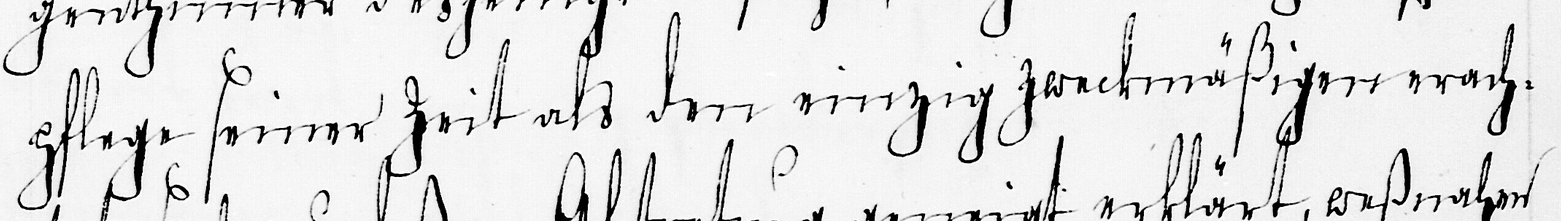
pflege seiner Zeit als den einzig zweckmäßigen erach¬
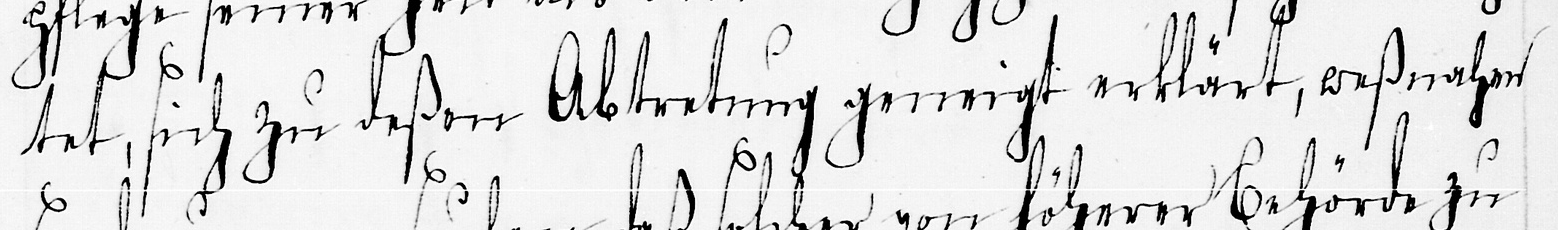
tet, sich zu deßen Abtretung geneigt erklärt, weßnahen
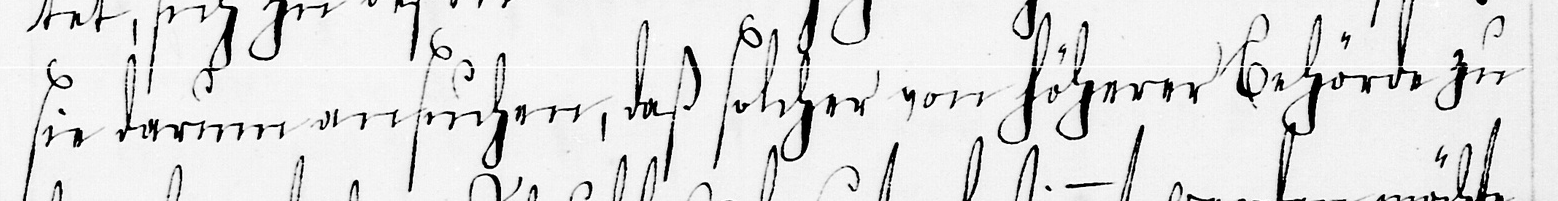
sie darum ansuchen, daß solcher von höherer Behörde zu
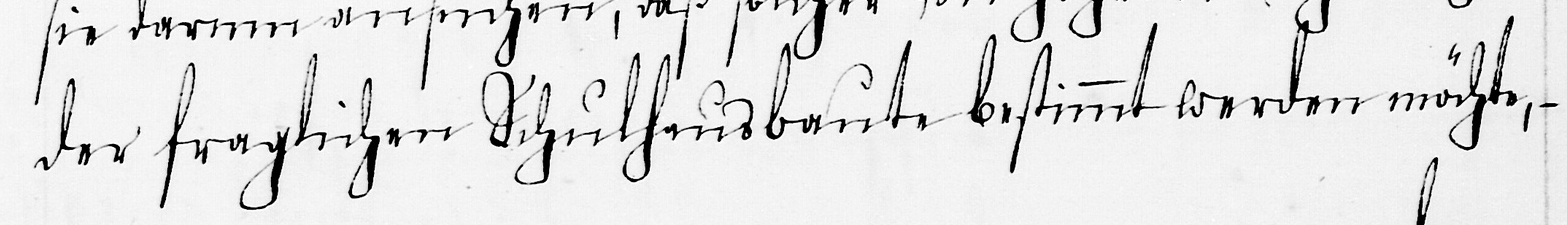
der fraglichen Schulhausbaute bestimmt werden möchte,
